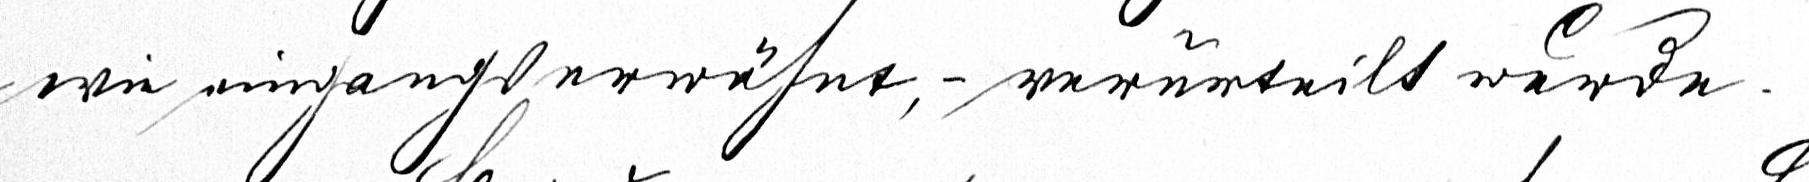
- wie eingangserwxxhnt,- verurteilt wurde.
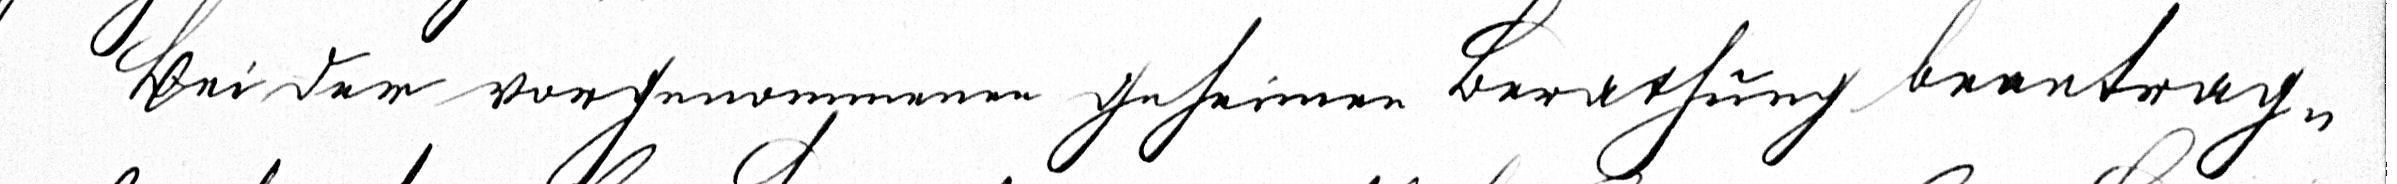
Bei der vorgenommenen Geheimen Berathung beantrag¬
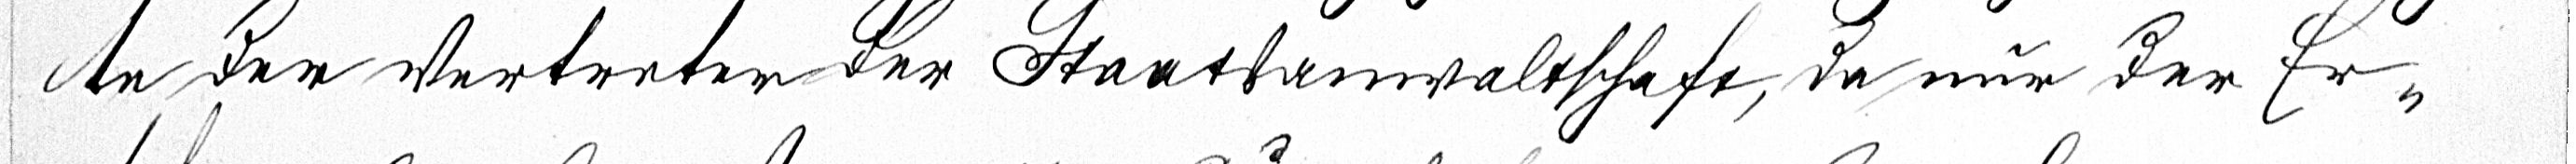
te der Vertreter der Staatsanwaltschaft, da nur der Er¬
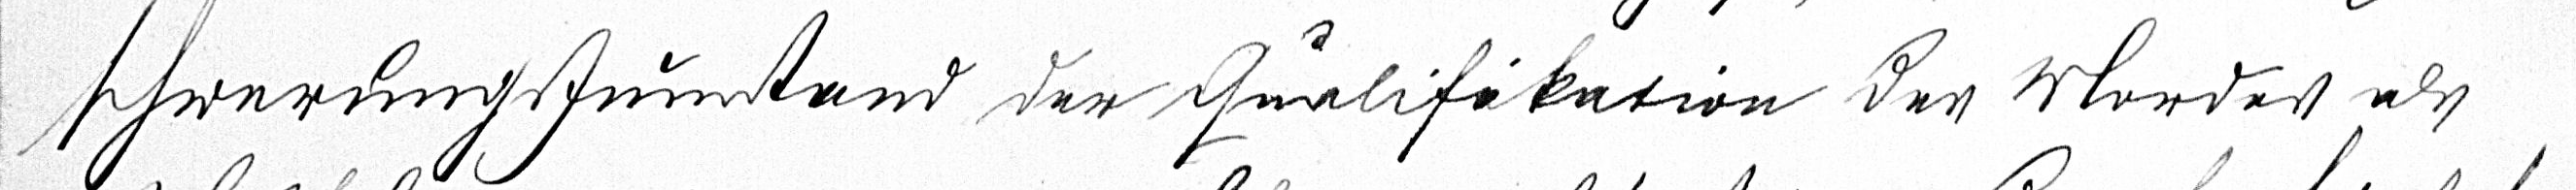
schwerungsumstand der Qualifikation des Mordes als
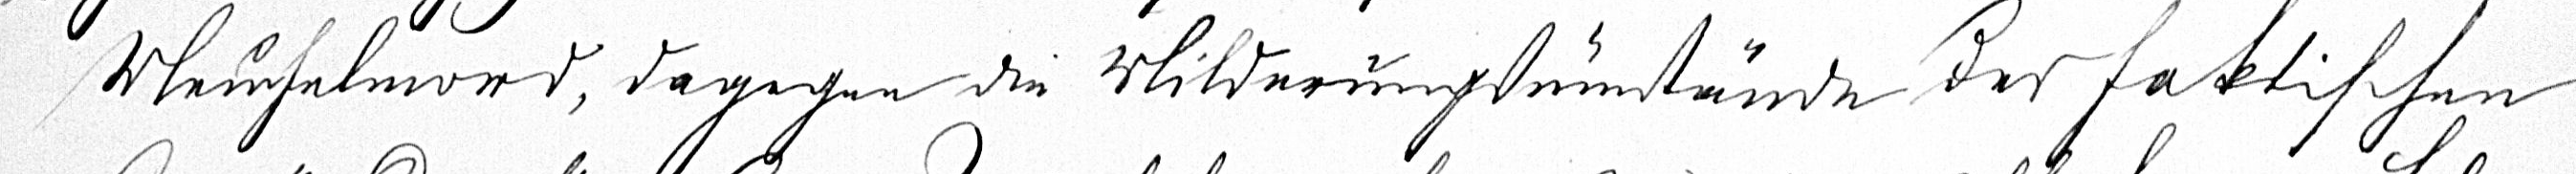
Meuchelmord, dagegen die Milderungsumstände der faktischen
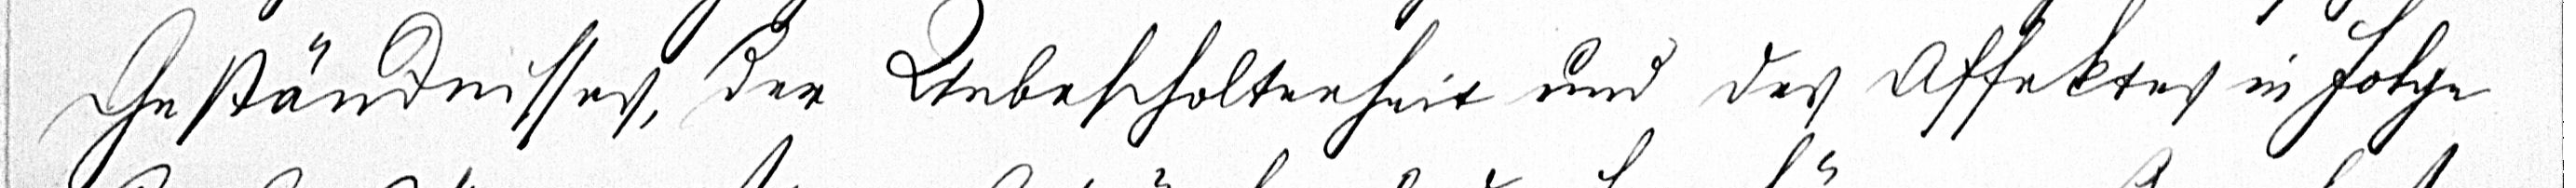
Geständnisses, der Unbescholtenheit und des Affektes in Folge
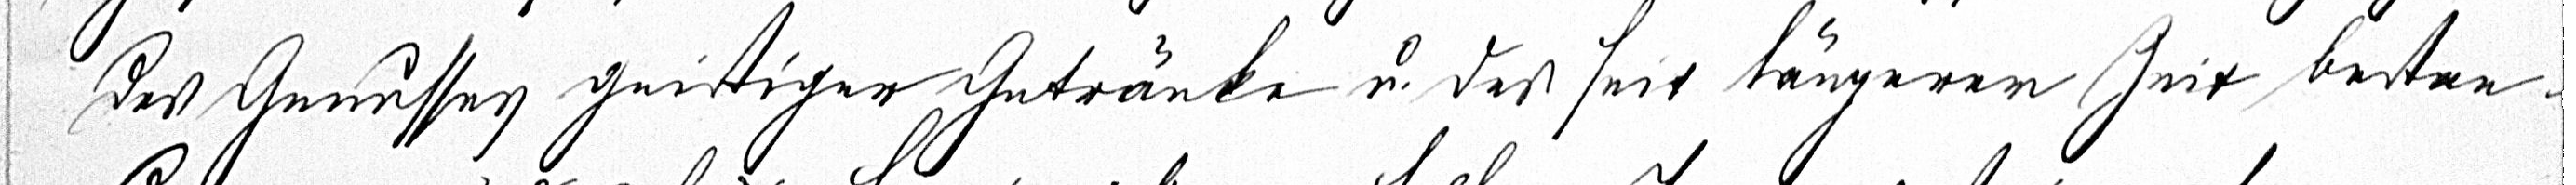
des Genusses geistiger Getränke u. des seit längeren Zeit bestan¬
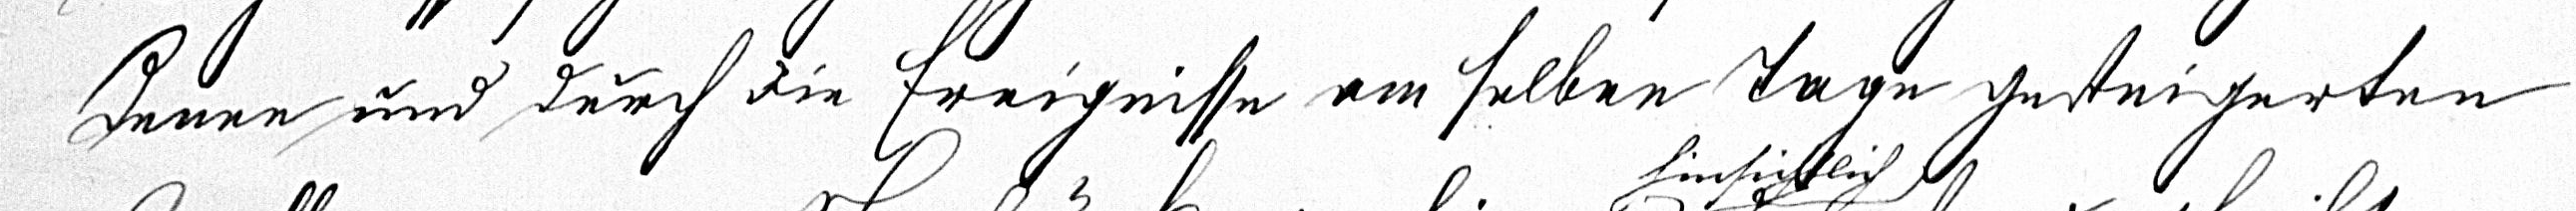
denen und durch die Ereignisse am helben Tage gesteigerten
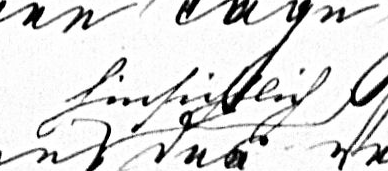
hinsichtlich
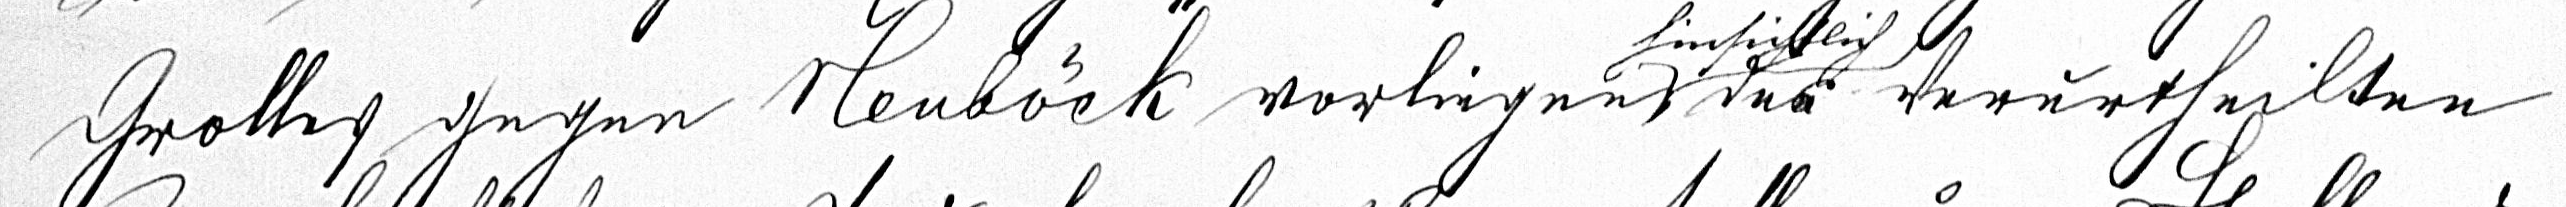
Grolles gegen Neuböck vorliegen des Verurtheilten
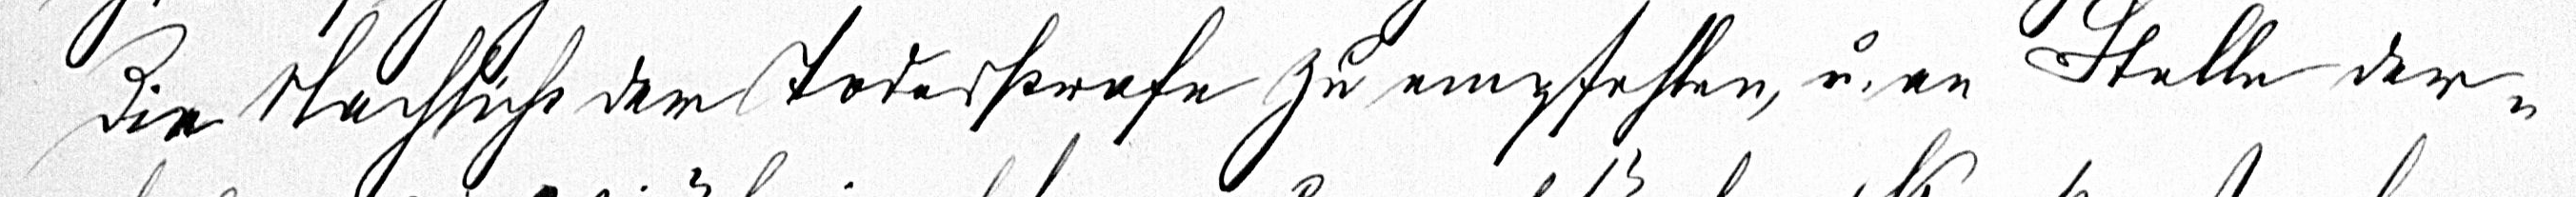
die Nachsicht der Todesstrafe zu empfehlen, u. an Stelle der¬
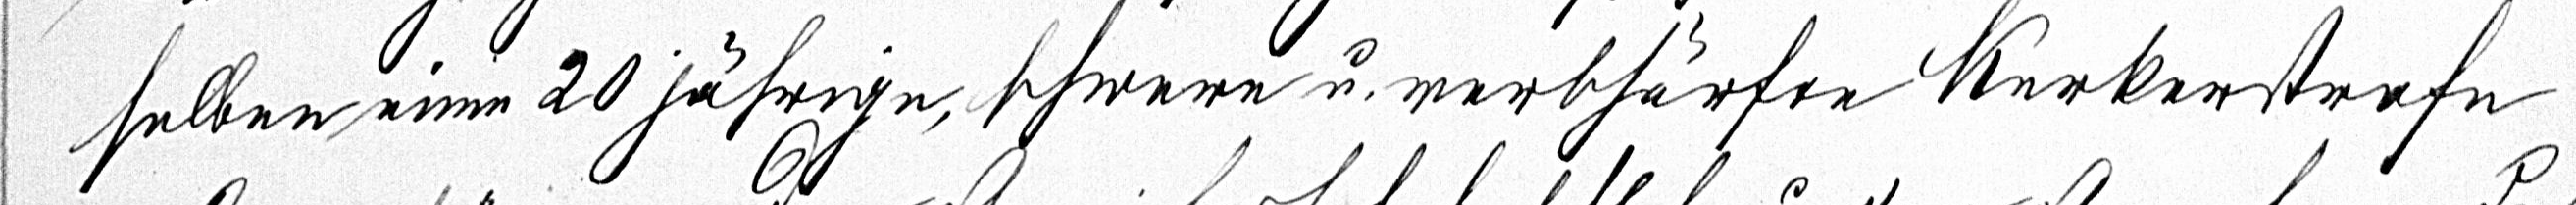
selben eine 20 jährige, schwere u. verschärfte Kerkerstrafe
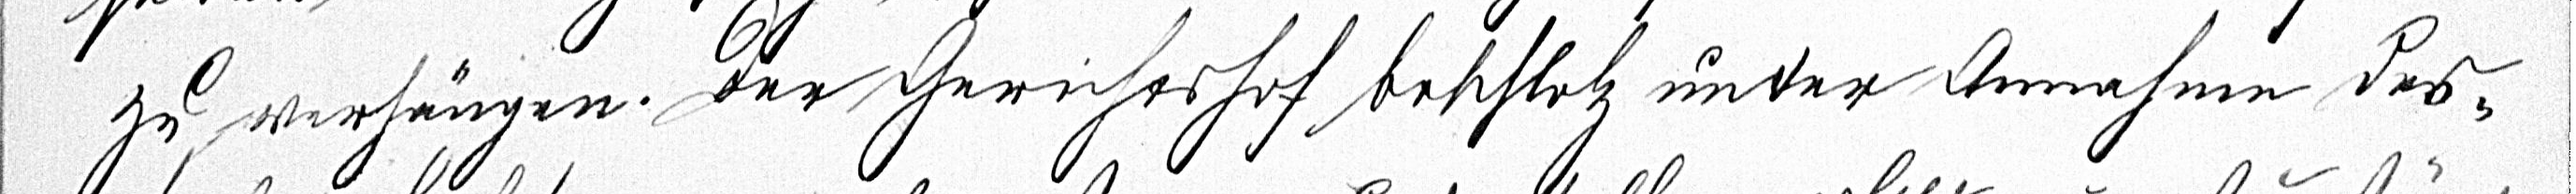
zu verhängen. Der Gerichtshof beschloß unter Annahme des¬
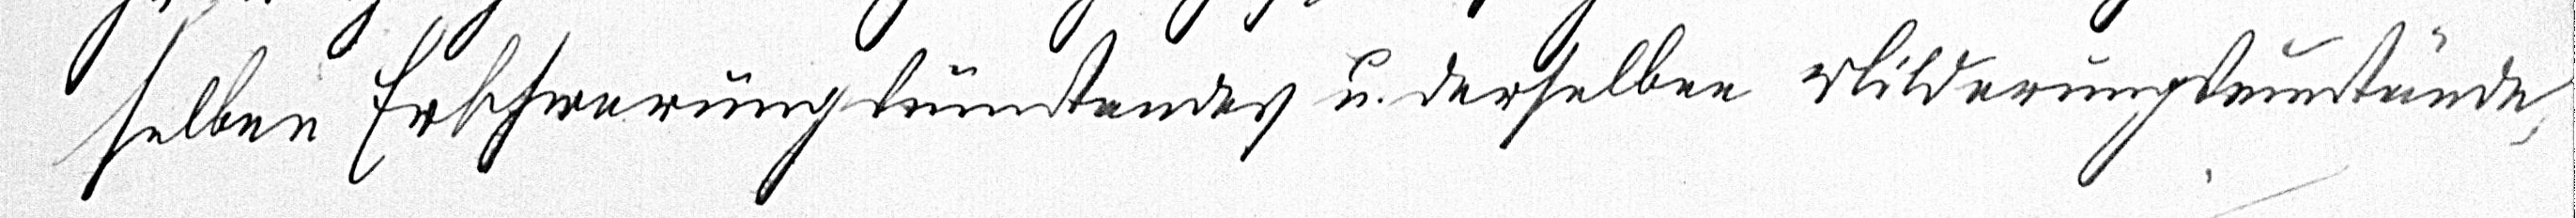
selben Erschwerungsumstandes u. derselben Milderungsumstände
